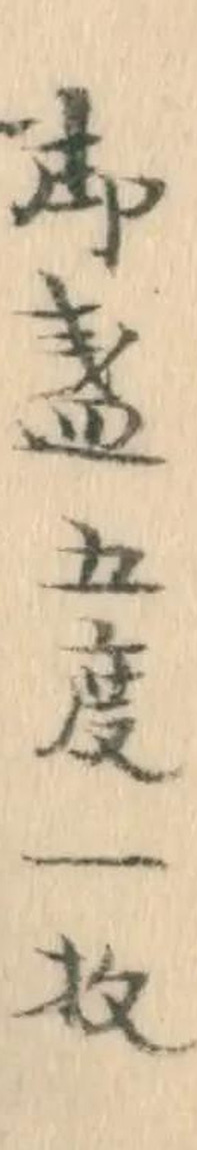御盞五度一枚
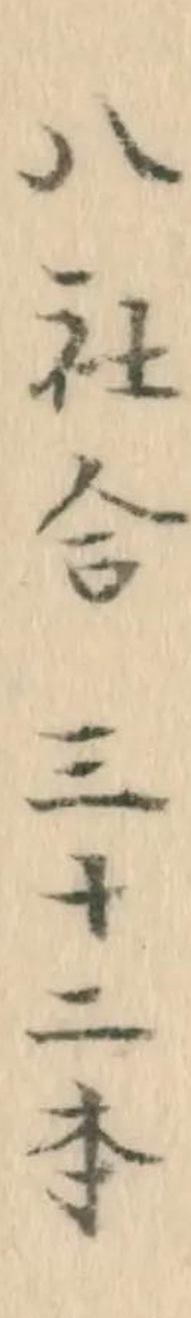八社合三十二本
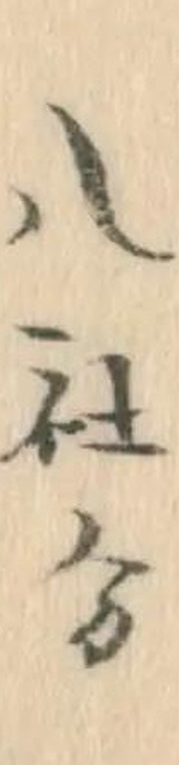八社合

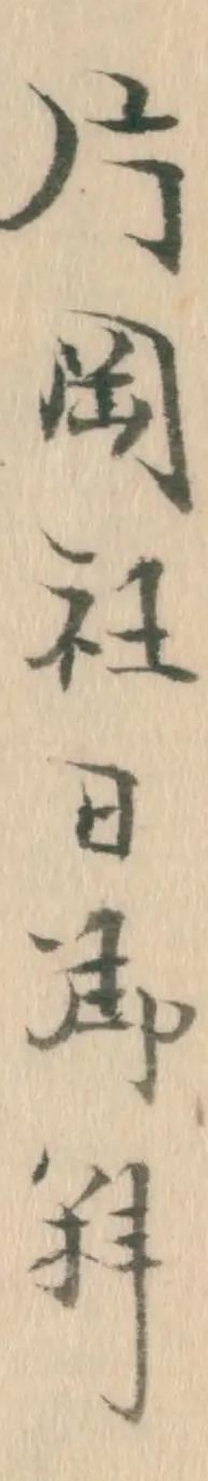片岡社日御料
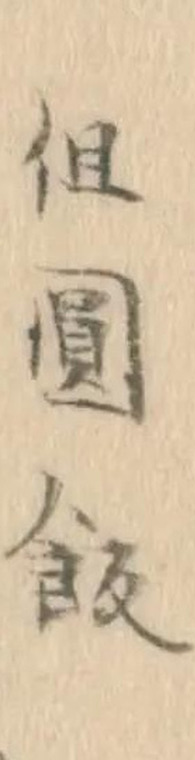但円飯
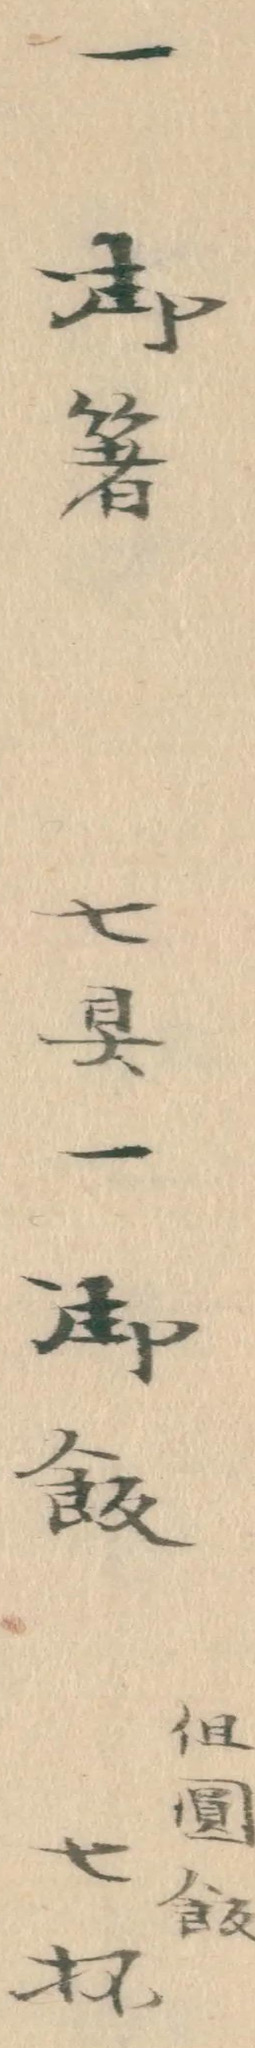一御箸七具一御飯七抔
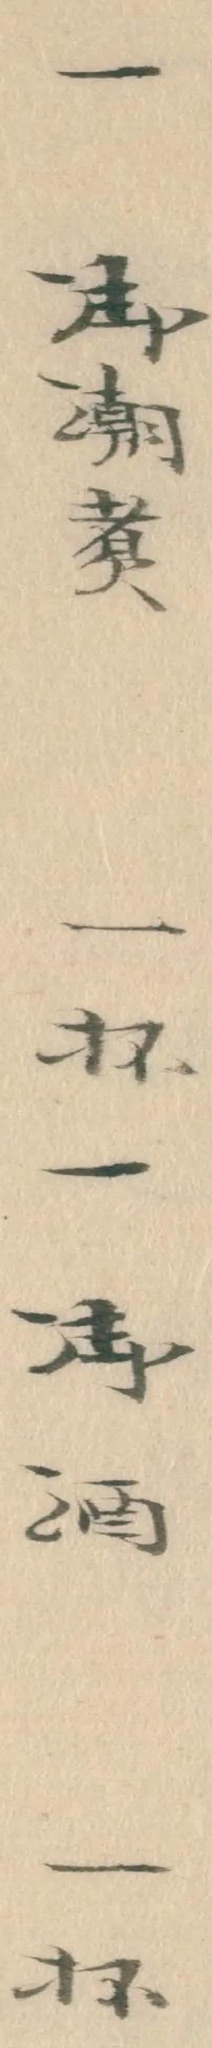一御潮煮一抔一御酒一抔
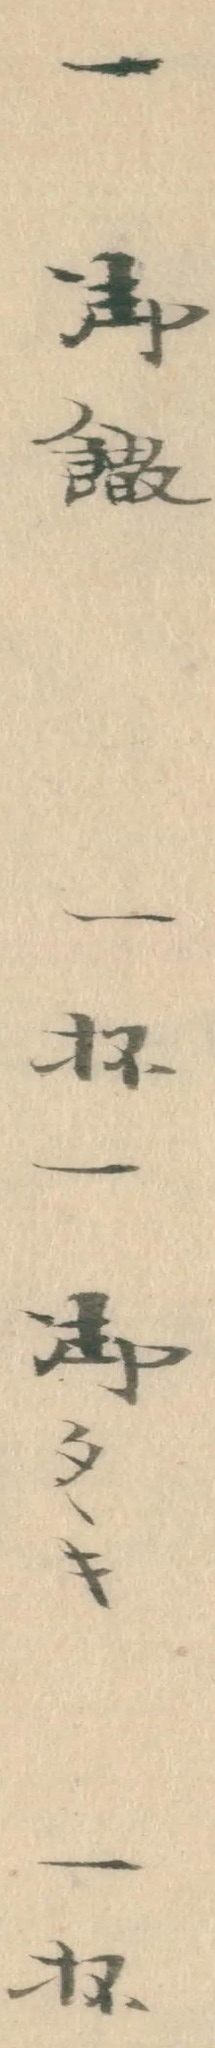一御饊一抔一御タヽキ一抔
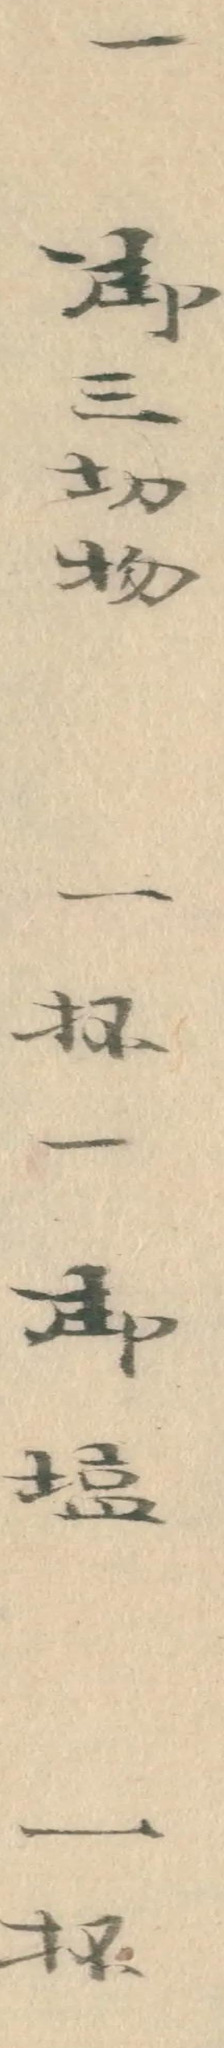一御三切物一抔一御塩一抔
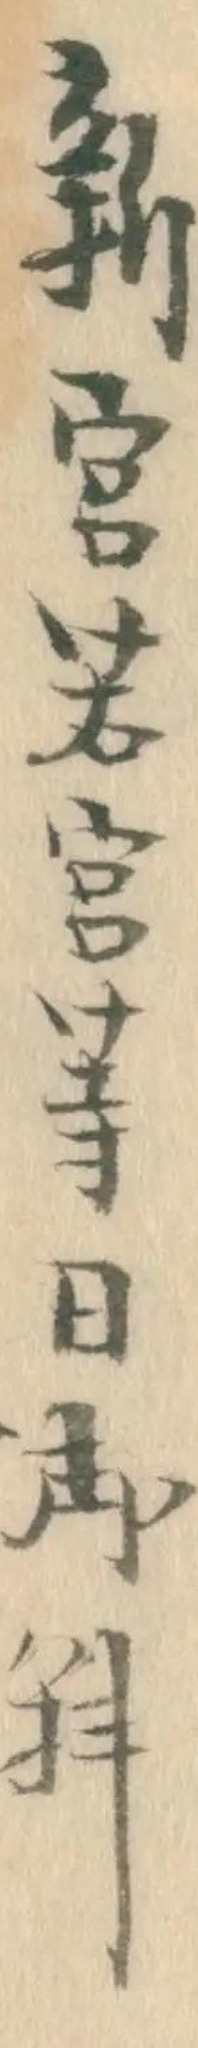新宮若宮等日御拝料
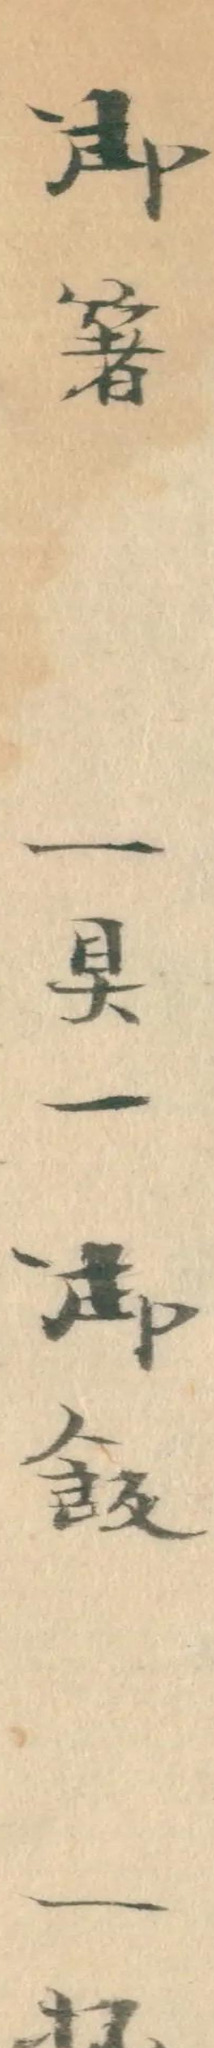一御箸一具一御飯一抔
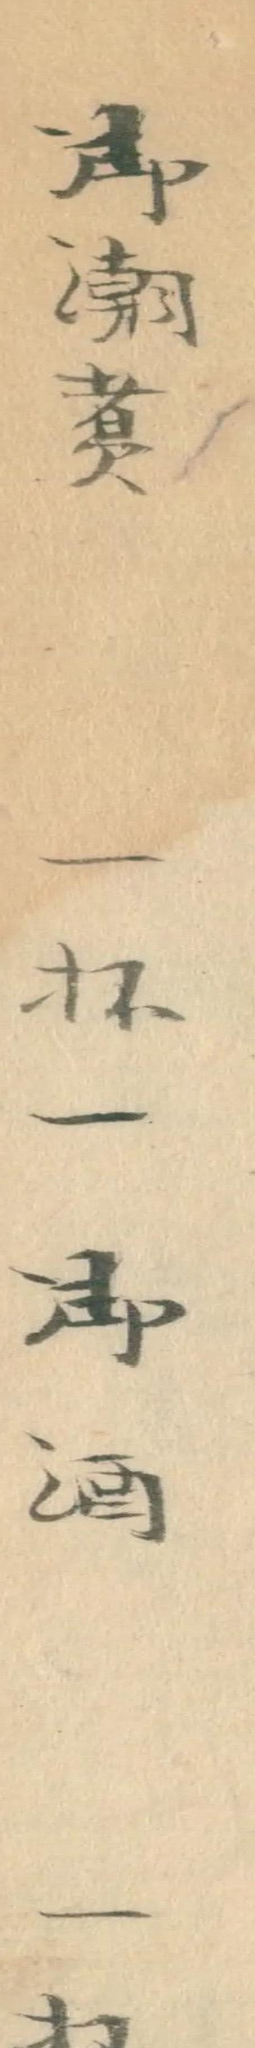一御潮煮一抔一御酒一抔

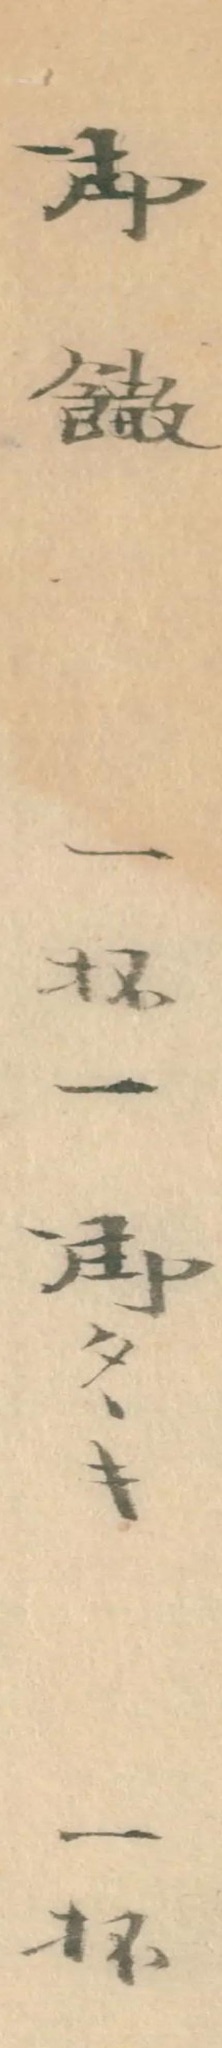一御饊一抔一御タヽキ一抔
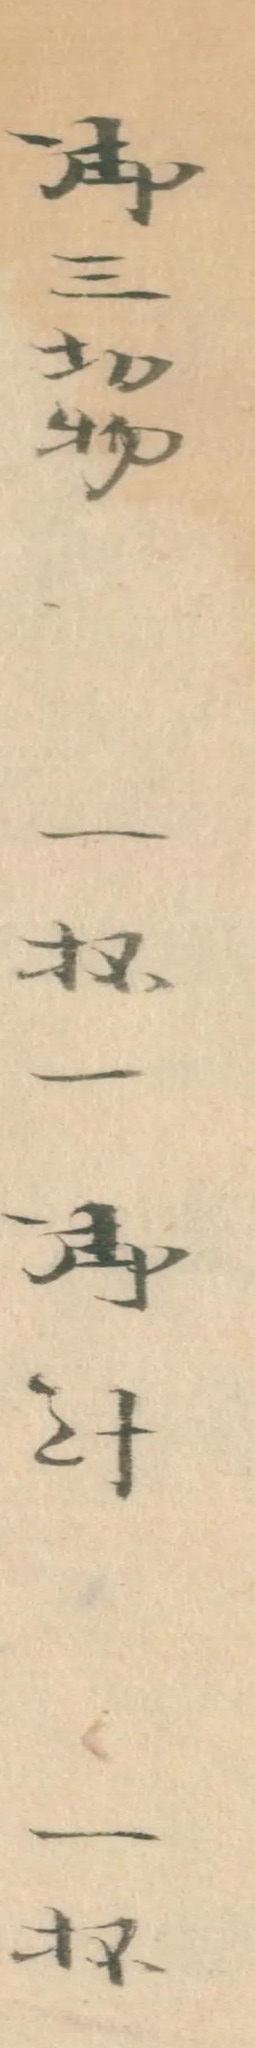一御三切物一杯一御汁一抔
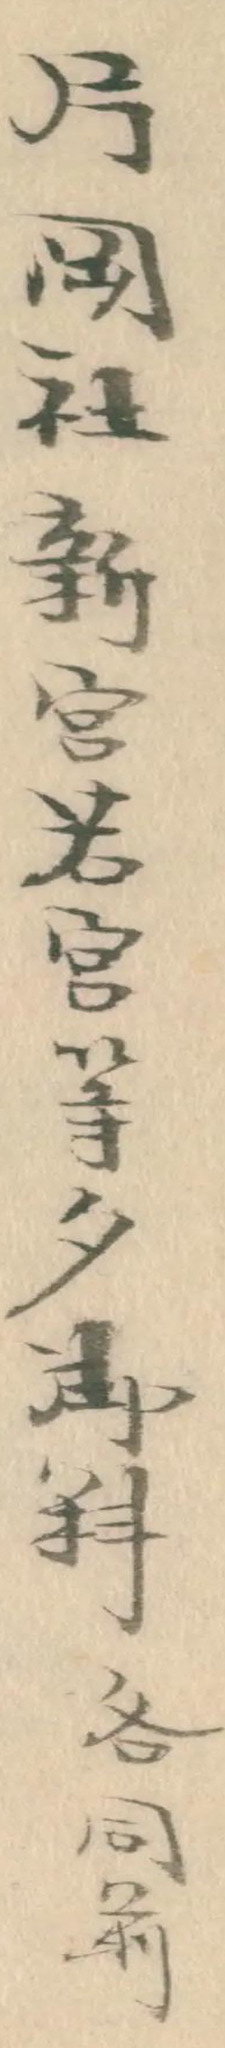片岡社新宮若宮等夕御料各同前
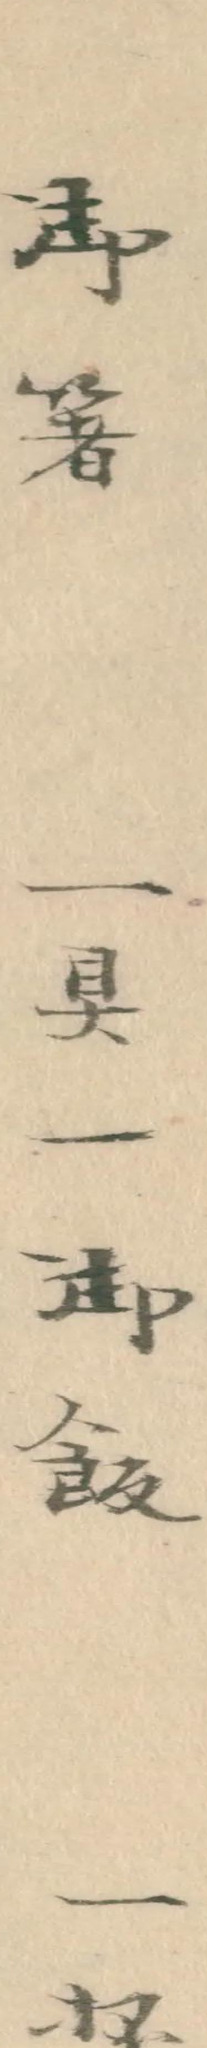一御箸一具一御飯一抔
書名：葵御祭供進之神饌諸品色目書
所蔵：国立国会図書館 National Diet Library, JAPAN
